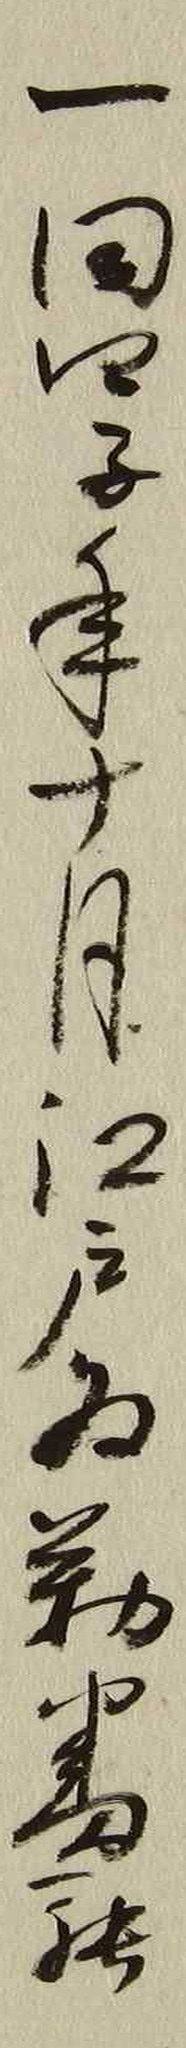一同四子年十月江戸為勤番罷
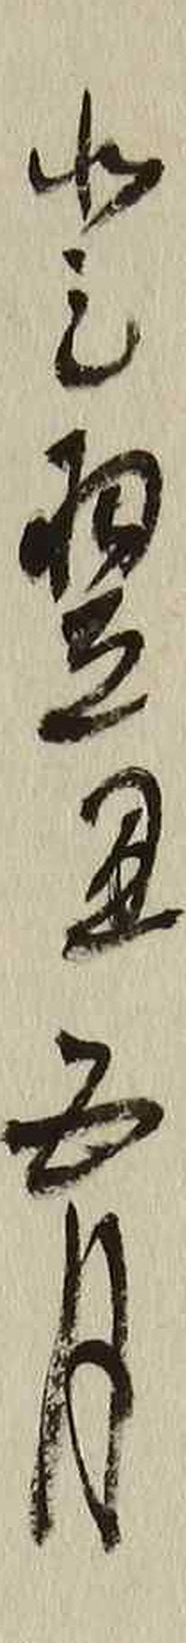登翌丑五月
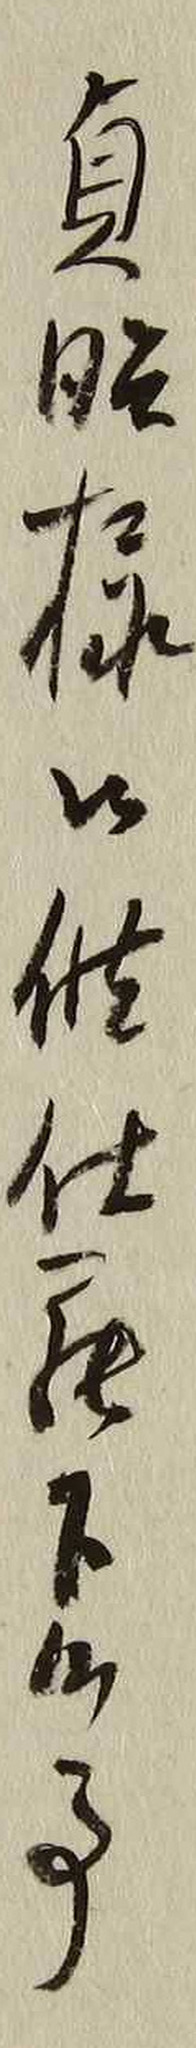貞昭様御供仕罷下候事
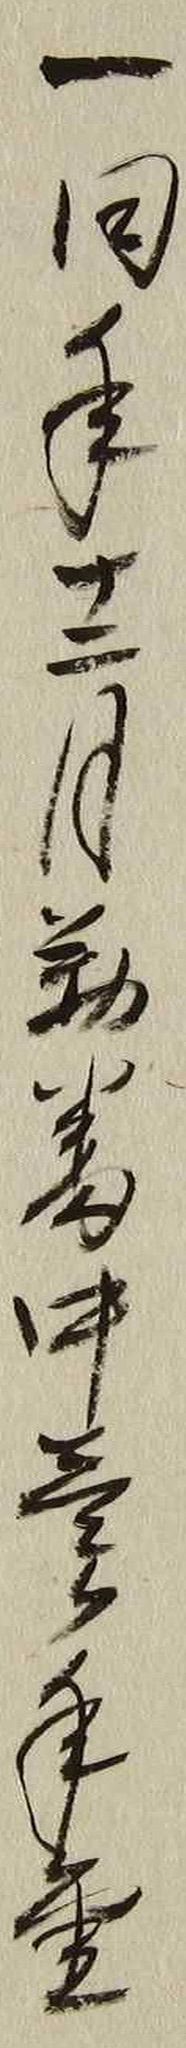一同年十二月勤番中壱ヶ年金
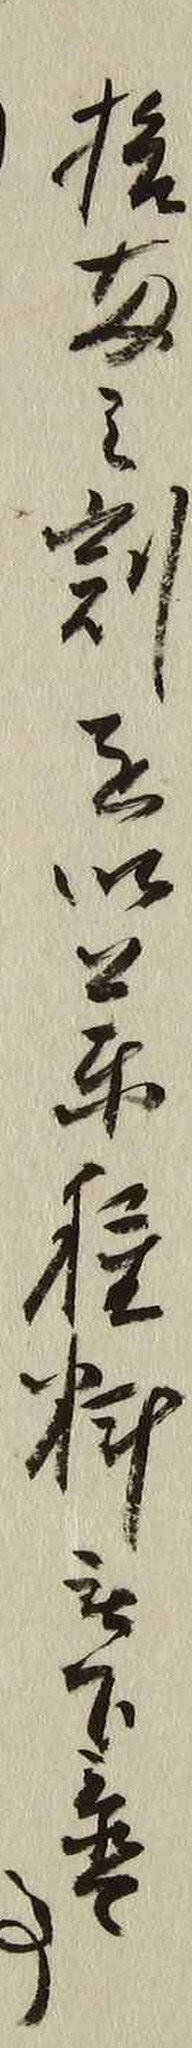拾両之割を以薬種料被下置候事
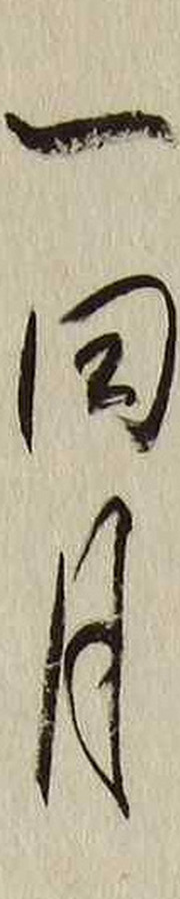一同月
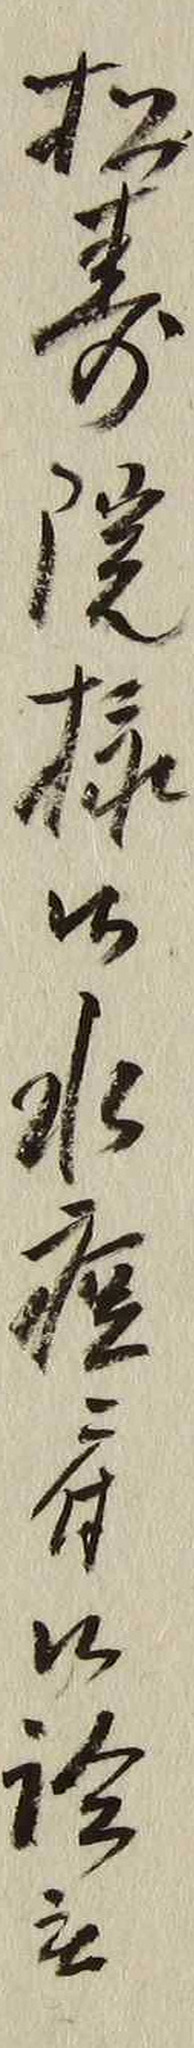松寿院様御水疱ニ付御診被
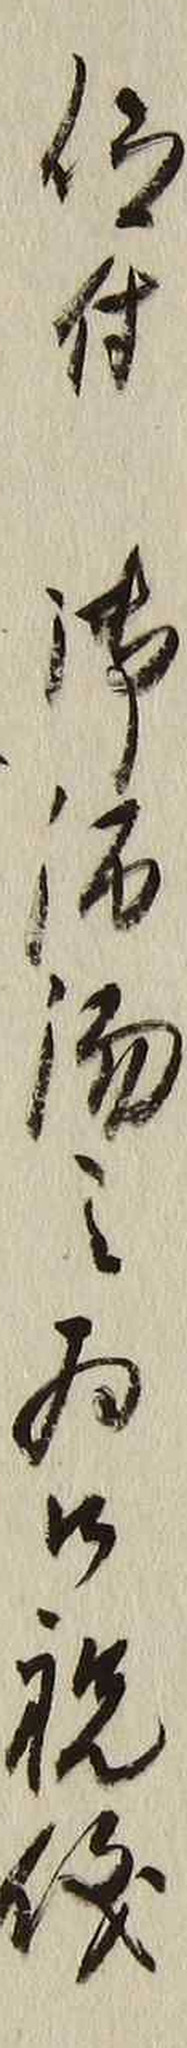仰付御酒湯之為御祝儀
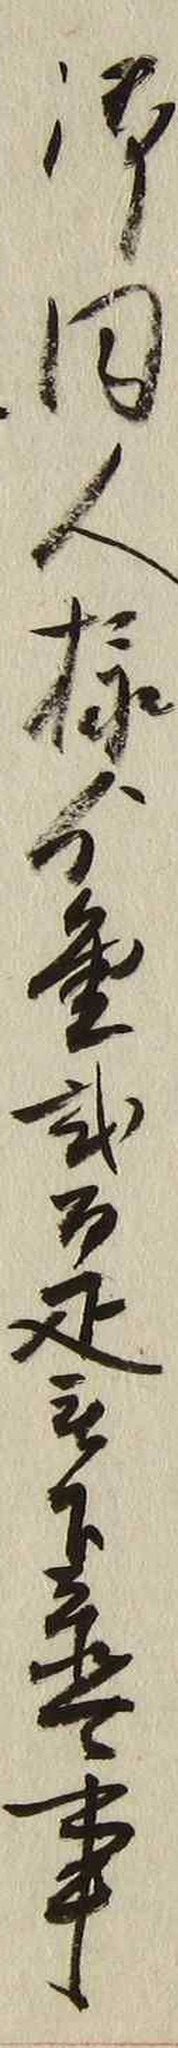御同人様ゟ金弐百疋被下置候事
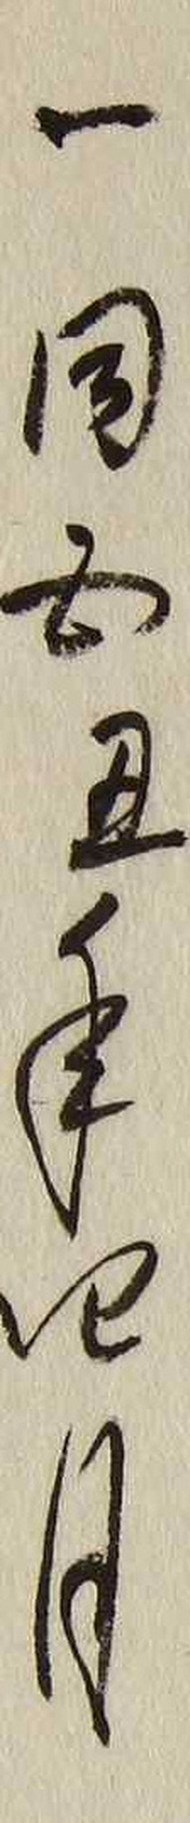一同五丑年四月
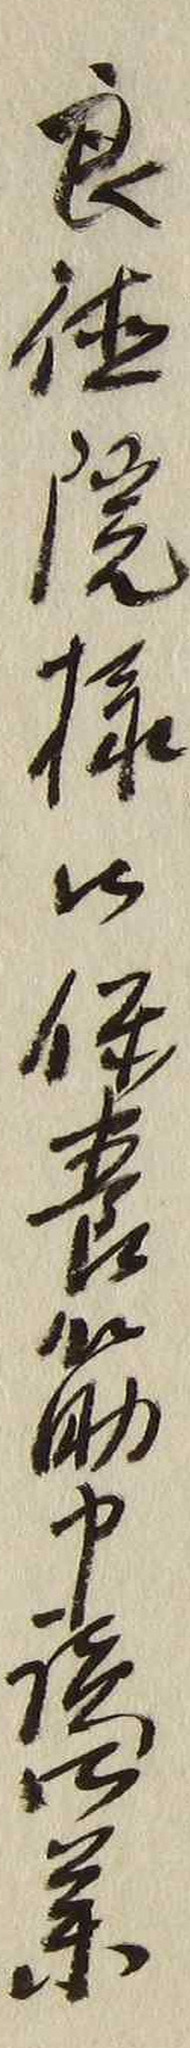良徳院様御保養筋申談御薬
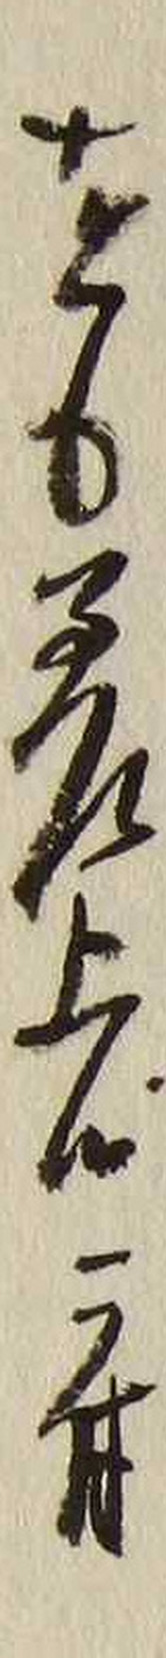をも差上候ニ付

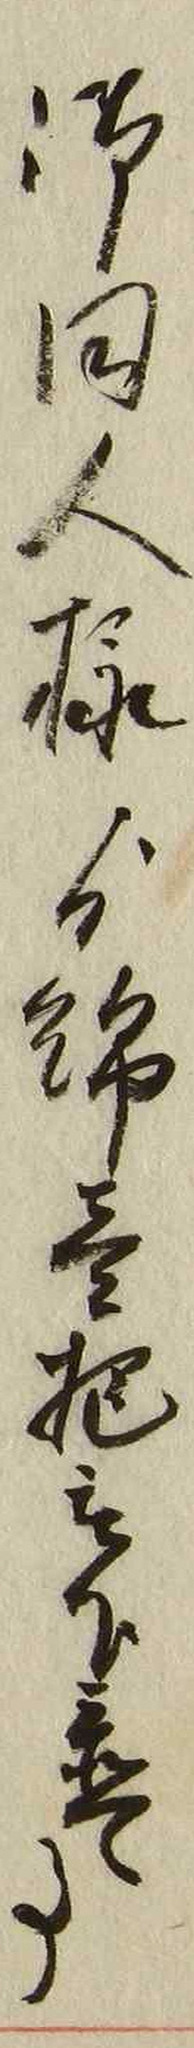御同人様ゟ綿壱把被下置候事
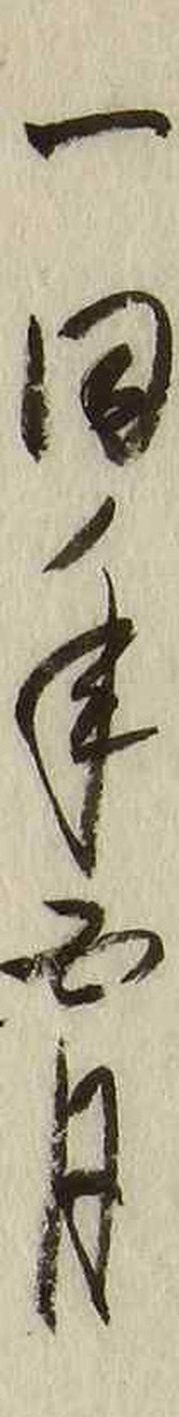一同年五月
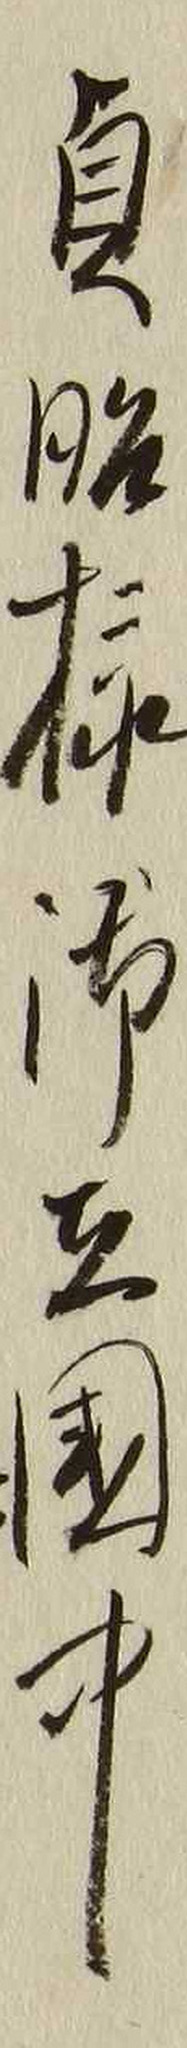貞昭様御在国中
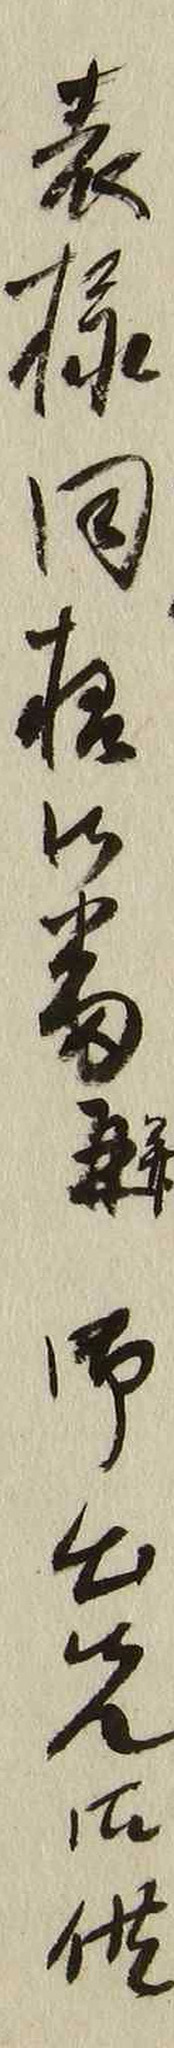表様同様御番再御出先御供
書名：諸士系譜　巻之353　す之部3
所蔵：会津若松市立会津図書館
